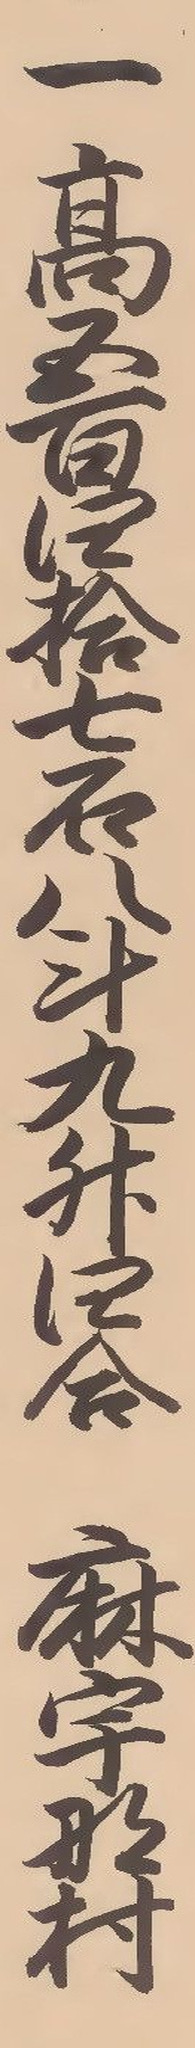一髙五百四拾七石八斗九升四合麻宇那名
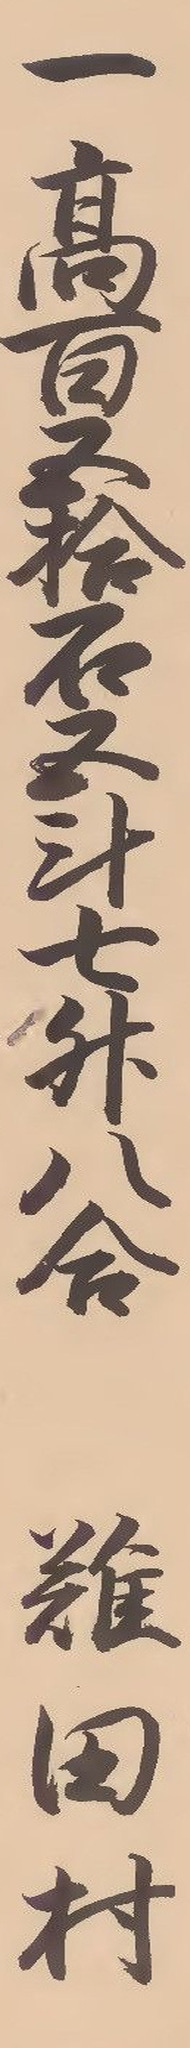一髙百五拾石五斗七升八合難田村

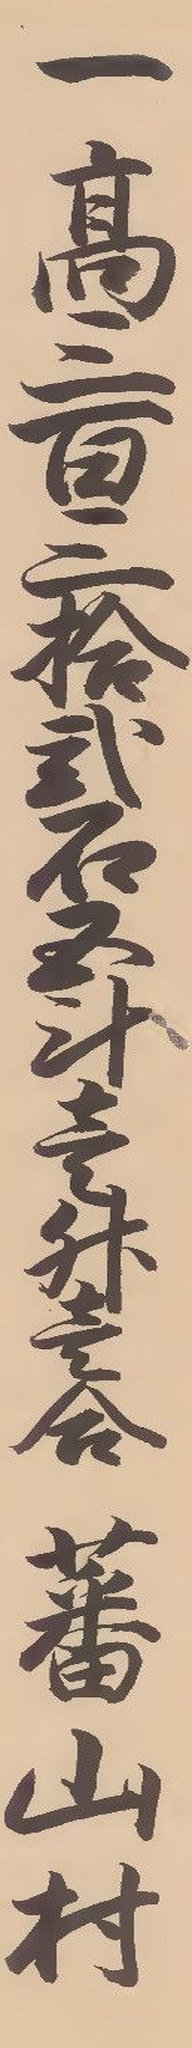一髙三百三拾弐石五斗壱升壱合蕃山村
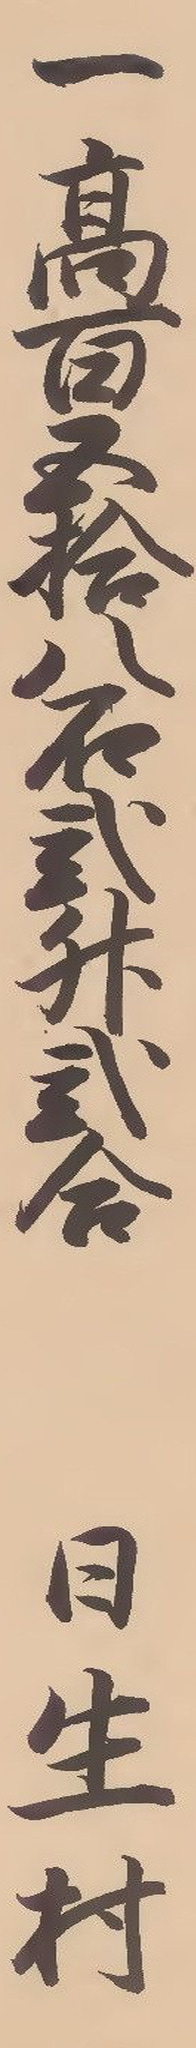一髙百五拾八石弐升弐合日生村
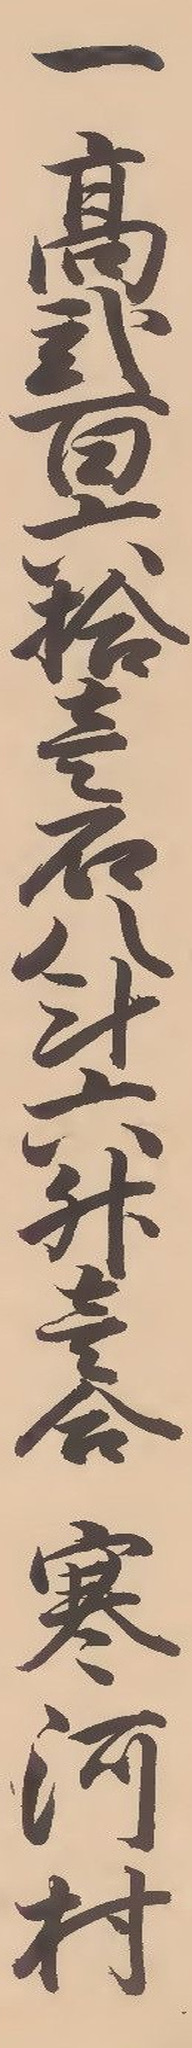一髙弐百六拾壱石八斗六升壱合寒河村
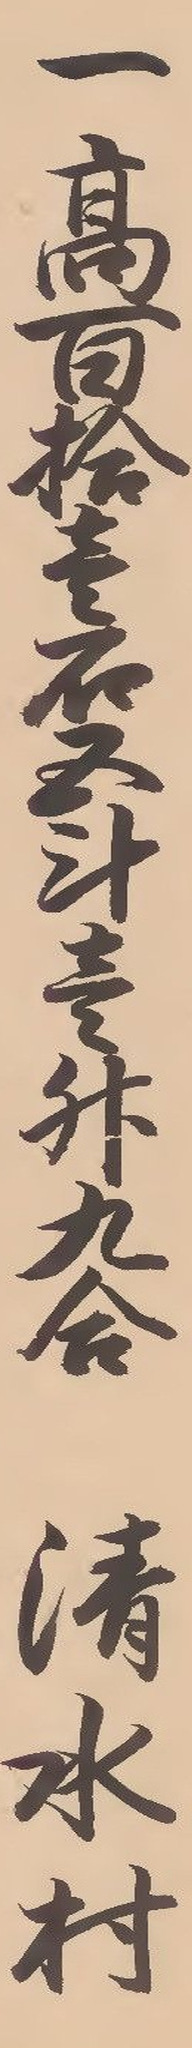一髙百拾壱石五斗壱升九合清水村
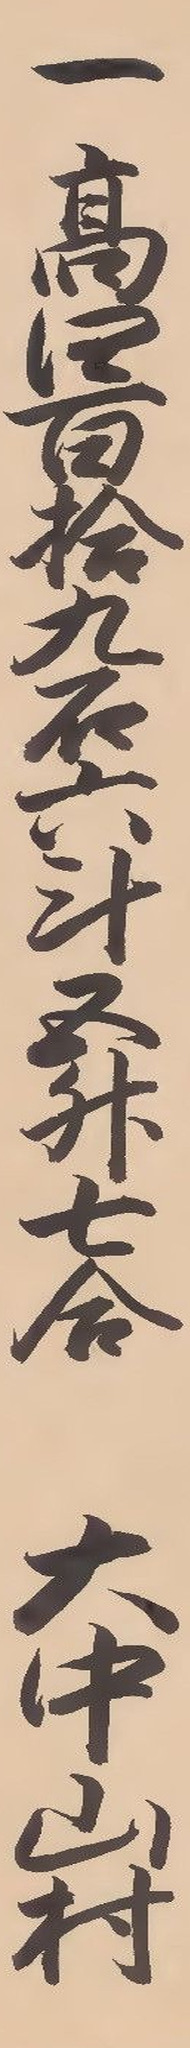一髙四百拾九石六斗五升七合大中山村
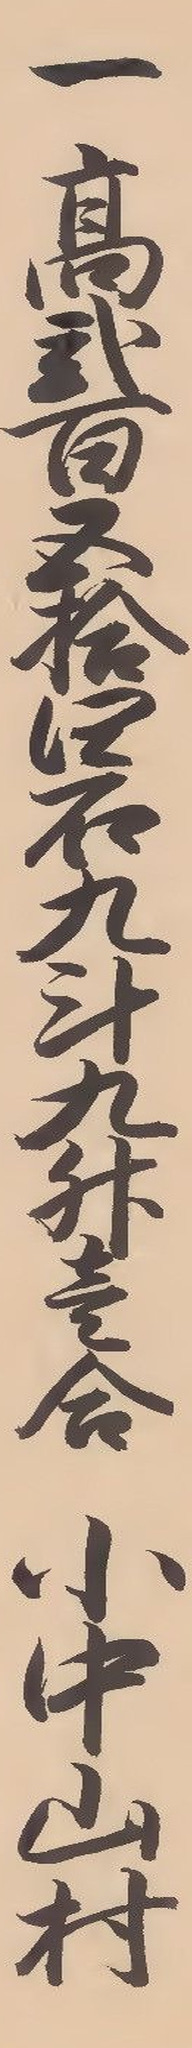一髙弐百五拾四石九斗九升壱合小中山村
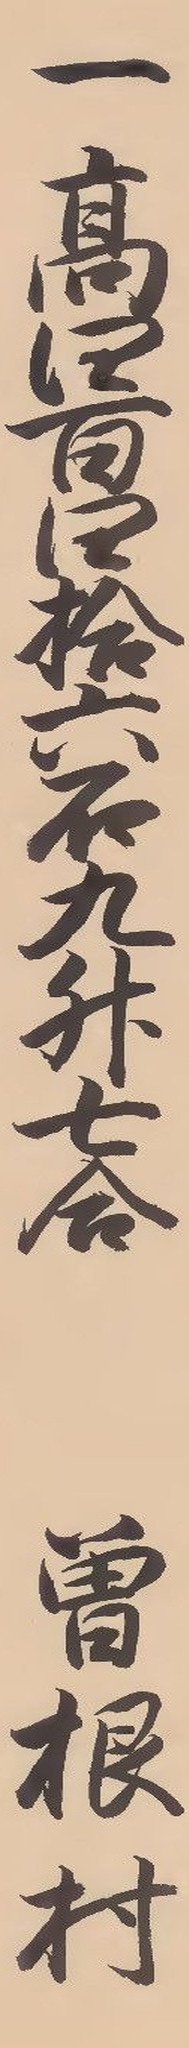一髙四百四拾六石九升七合曽根村
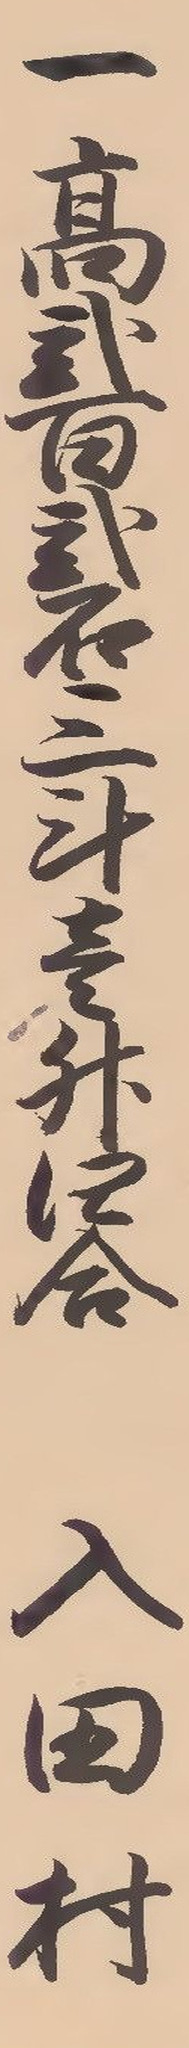一髙弐百弐石三斗壱升四合入田村

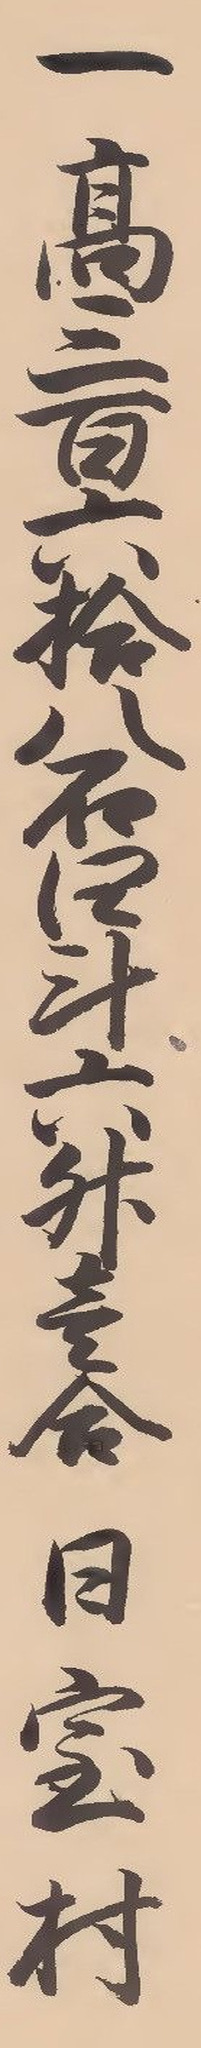一髙三百六拾八石四斗六升壱合日室村
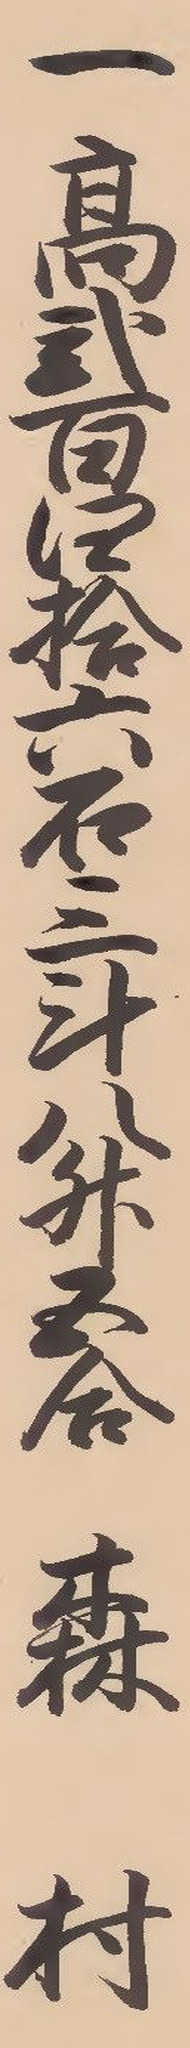一髙弐百四拾六石三斗八升五合森村
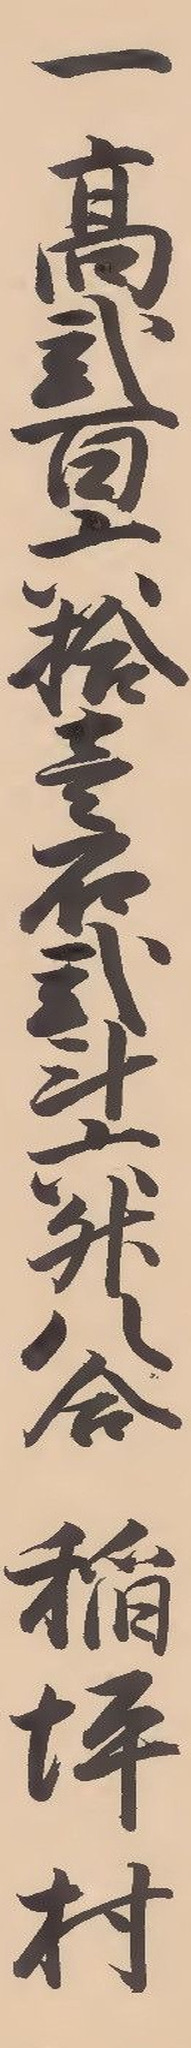一髙弐百六拾壱石弐斗六升八合稲坪村
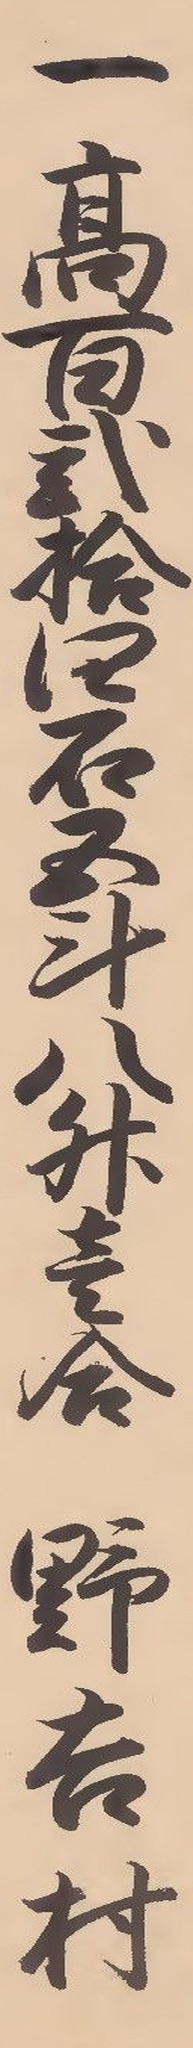一髙百弐拾四石五斗八升壱合野吉村
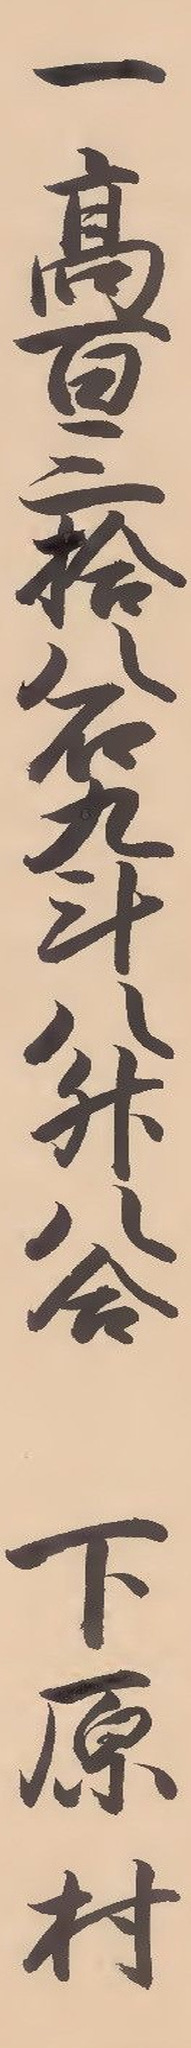一髙百三拾八石九斗八升八合下原村
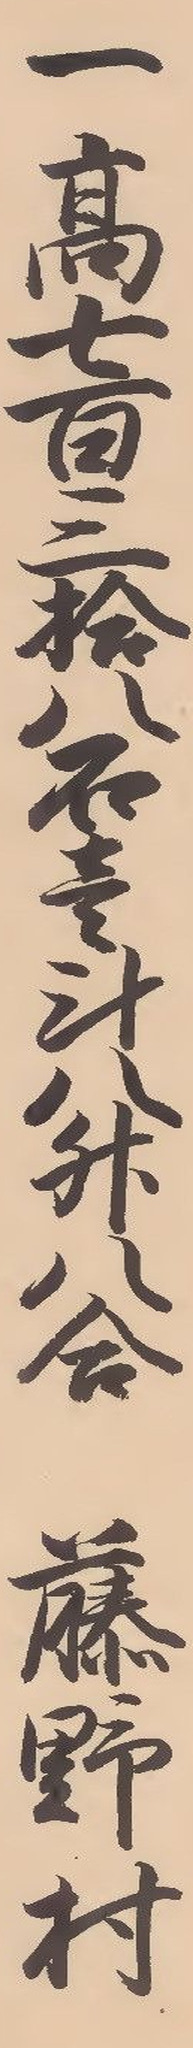一髙七百三拾八石壱斗八升八合藤野村
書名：備前国郷帳
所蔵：国立公文書館 National Archives of Japan
